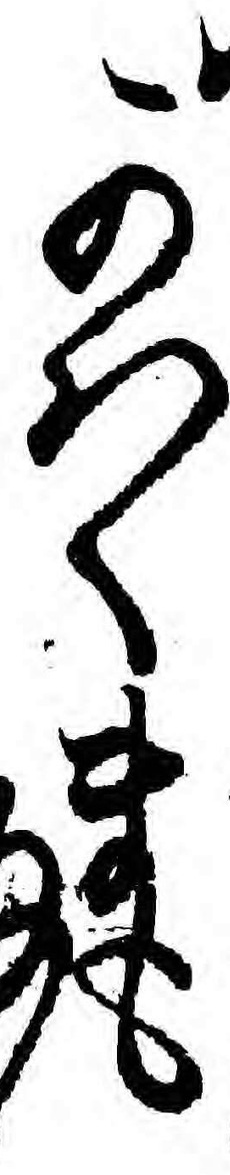かはくまも
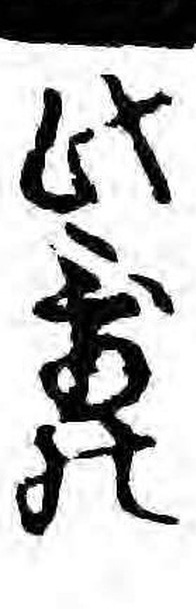此哥の
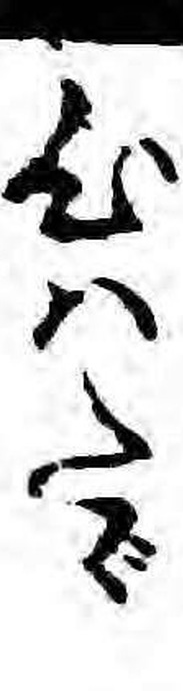心はたゞ
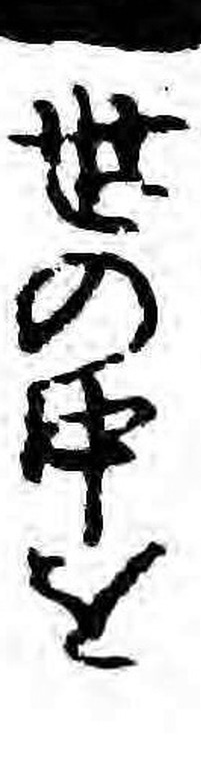世の中を
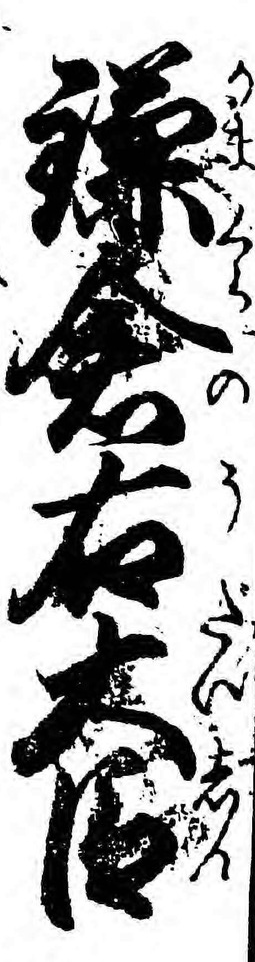鎌倉右大臣
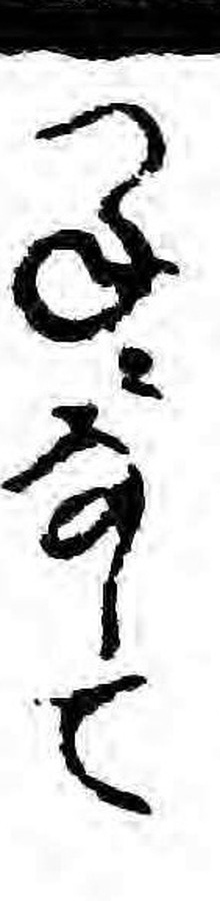つねになして
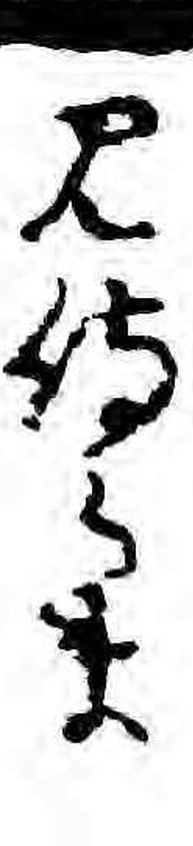見侍らま
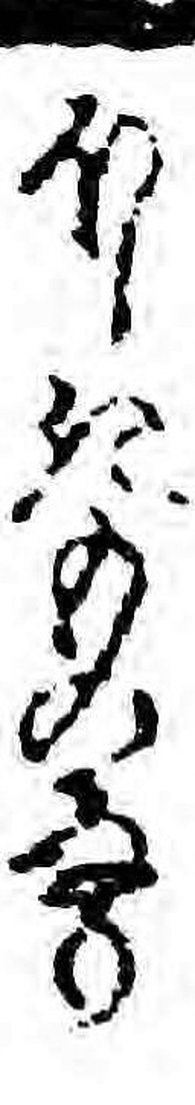ほしきものなり
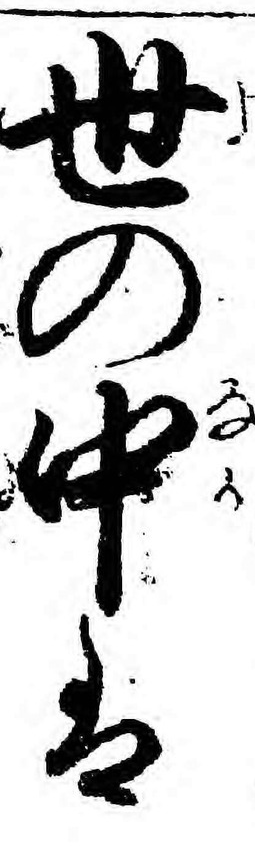世の中は
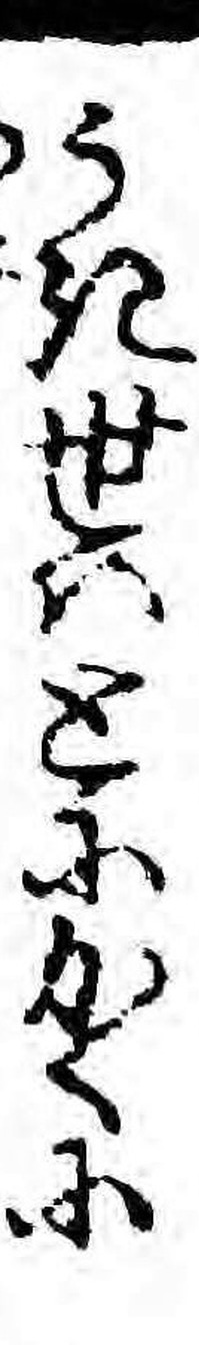うき世はとにかくに
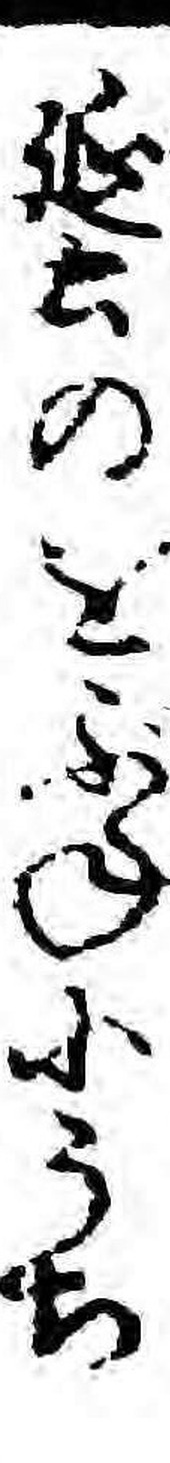蜑のをぶねにうち
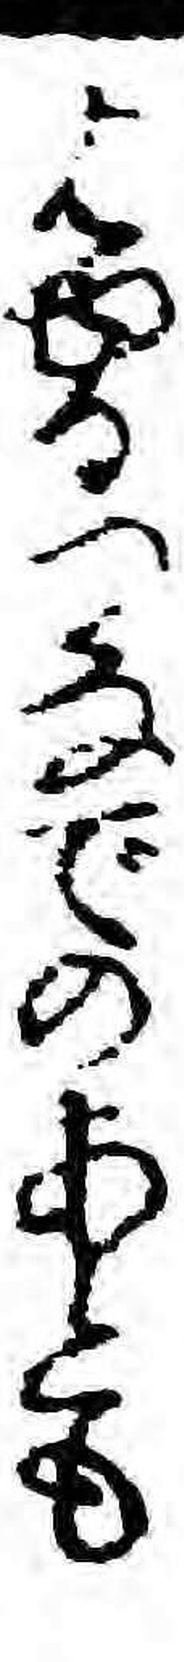はゆるつなでのあとも
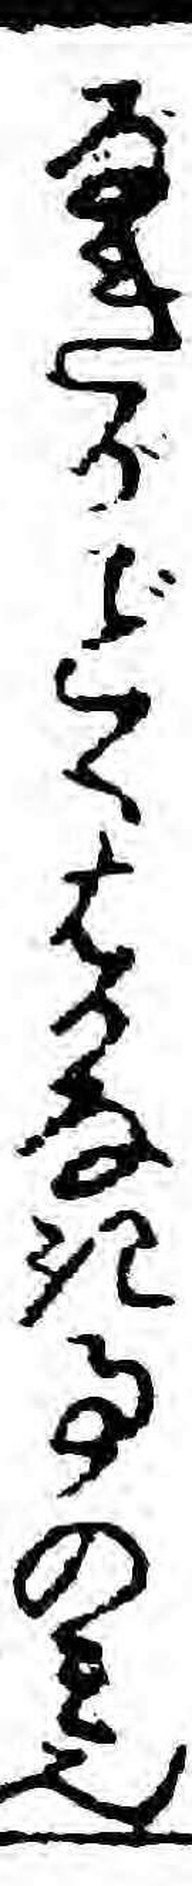なきがごとくはかなきことのみ也
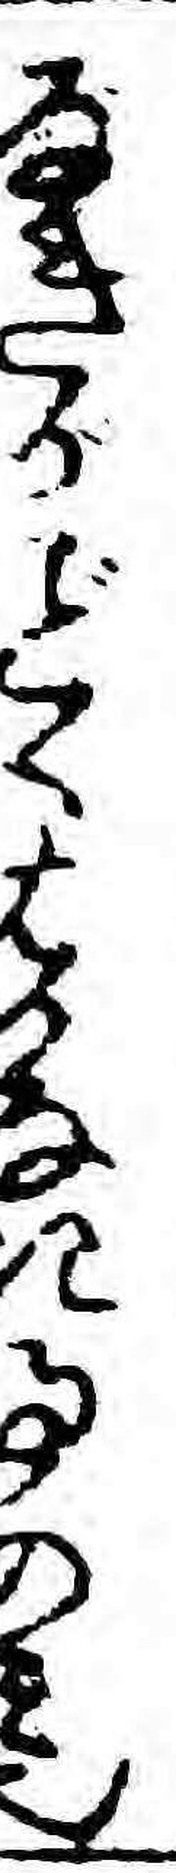なきがごとくはかなきことのみ也
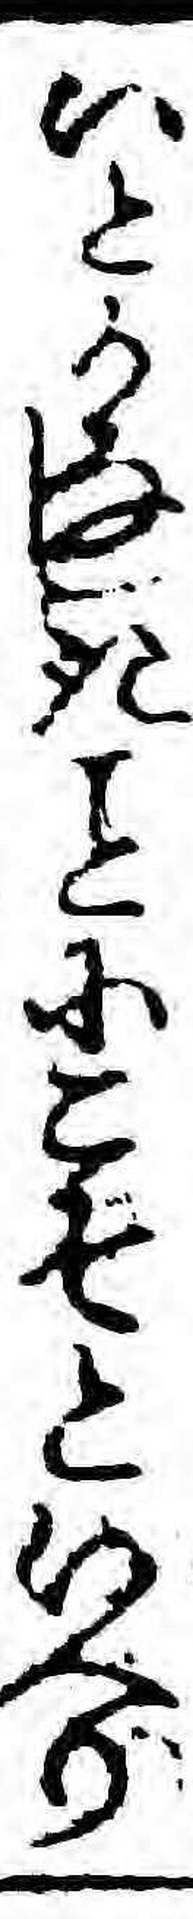いとかなしきことにこそといへり
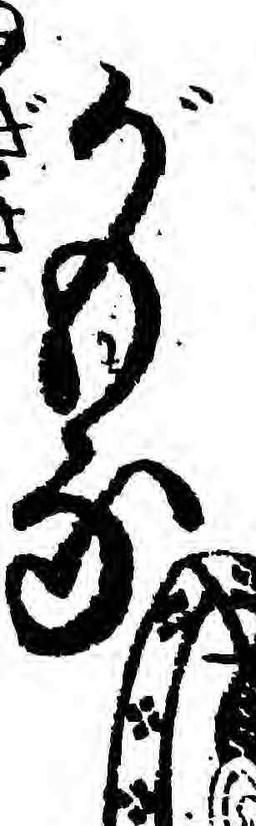がもな
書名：頭書和歌注譯／壽賀多百人一首小倉錦
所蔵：国文学研究資料館
